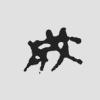成
